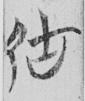居
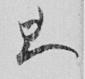也
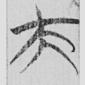夫
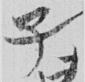子
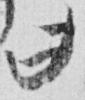曰
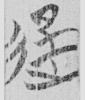○（坐）
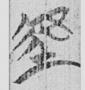○（吾）
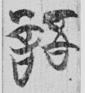語
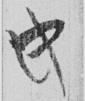女（汝）
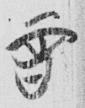言
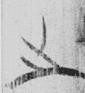之
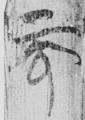而
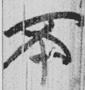不
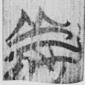義
